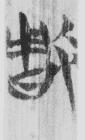{周攴}
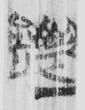鏤
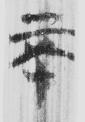不
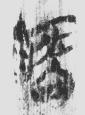{疒虎口}
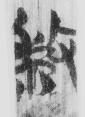殺
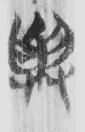與
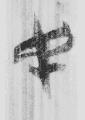民
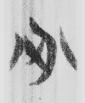分
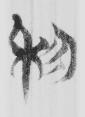利
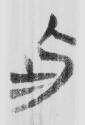此
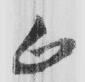㠯（以）
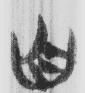自
